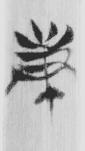庚
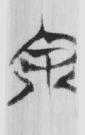余
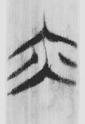亦
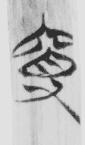{宀目又}
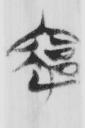{穴躳}
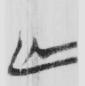亡
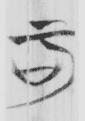可
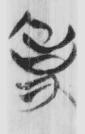事
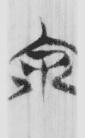余
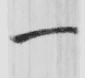一
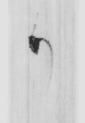人
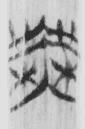無
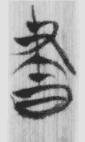晝
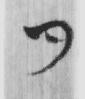夕
